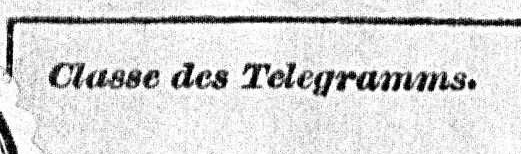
Classe des Telegramms.
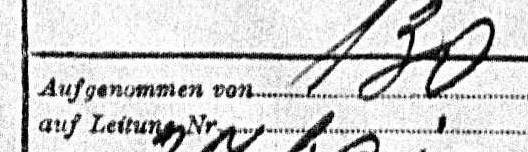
Aufgenommen von.........................130.................................................
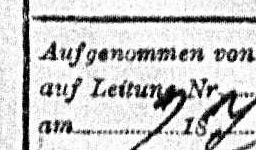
auf Leitung Nr..................................................................................
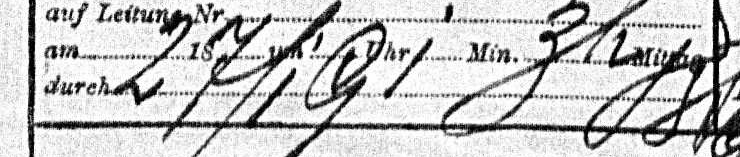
am...........18......um............Uhr..............Min.............xx........... Mittag
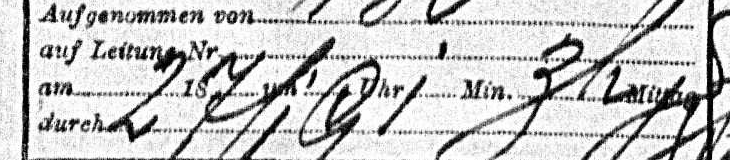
durch......................................27/191.............................................................
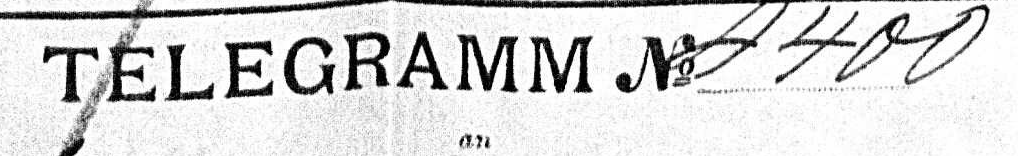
Telegramm No. 4400
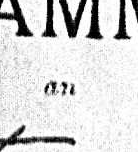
an
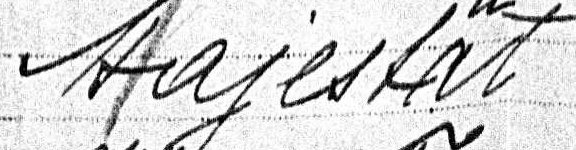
Majestät
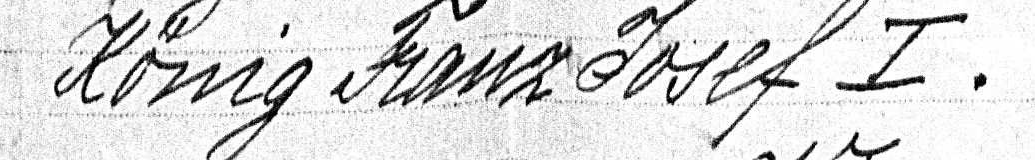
König Franz Josef I.
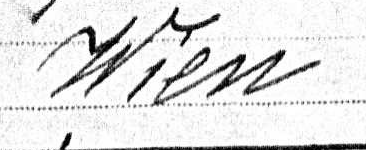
Wien
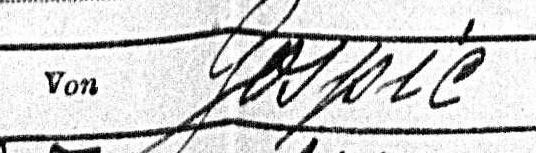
Von Gospic
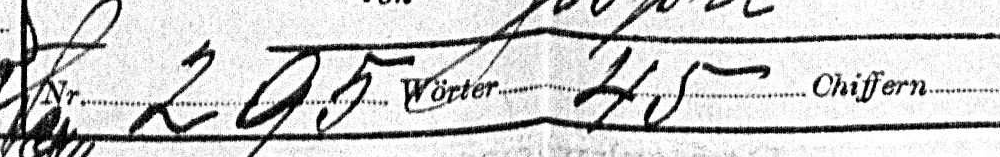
Nr................295.................Wörter.............45..................Chiffern.................
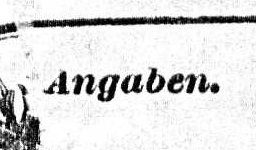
Angaben.
